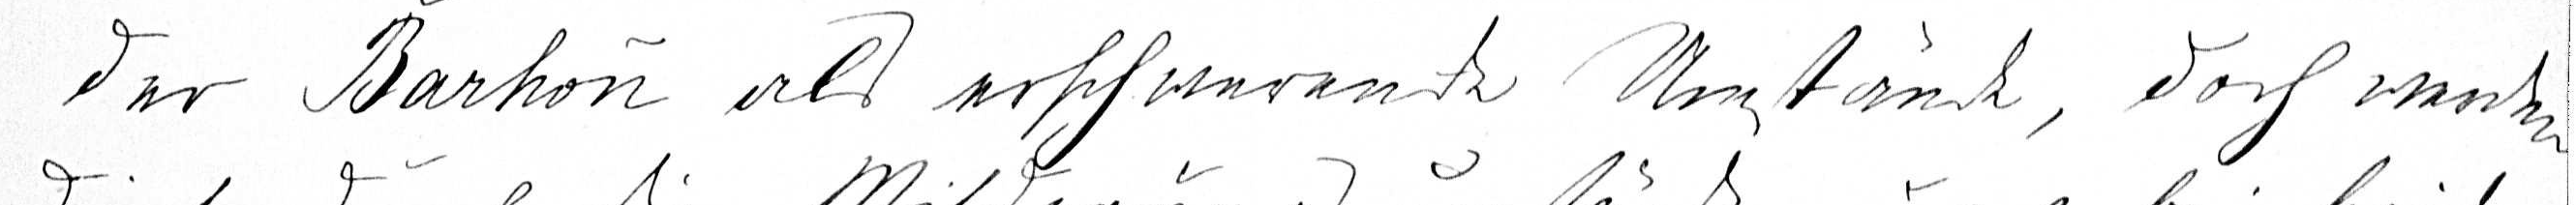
der Barhxx als erschwerende Umstände, doch werden
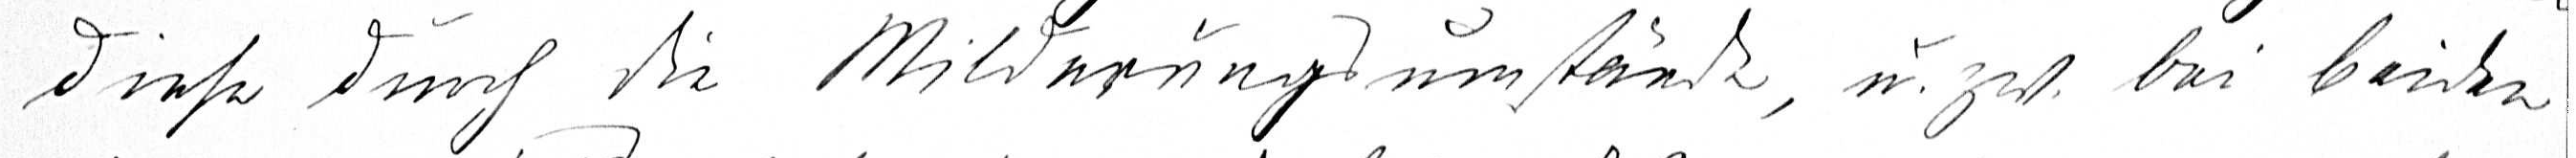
diese durch die Milderungsumstände, u. zw. bei beiden
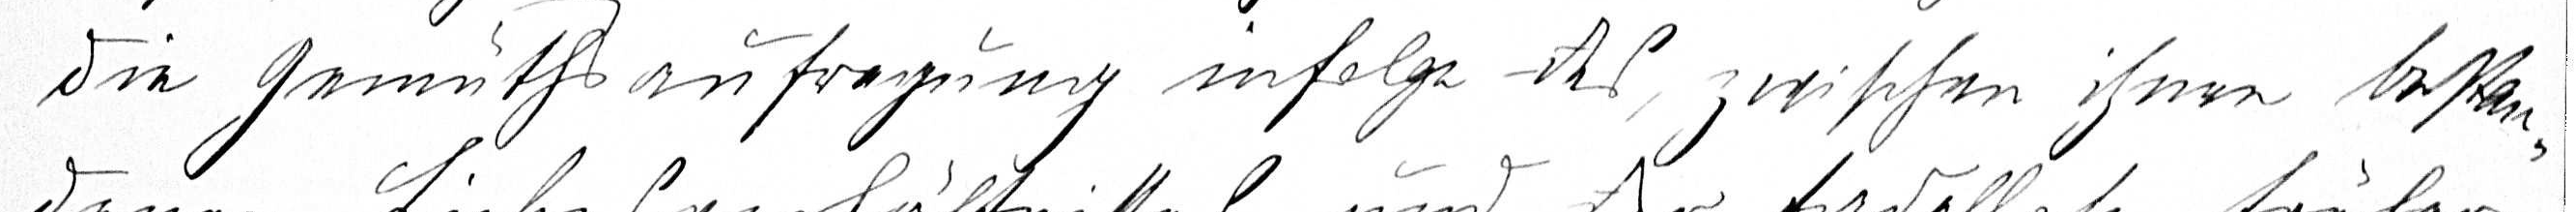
die Gemüthsaufregung infolge des, zwischen ihnen bestan¬
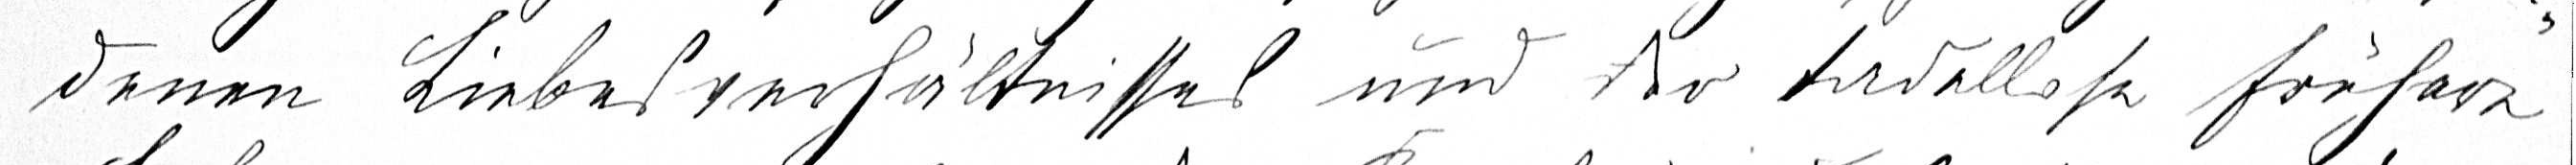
denen Liebesverhältnisses und der tadellose frühere
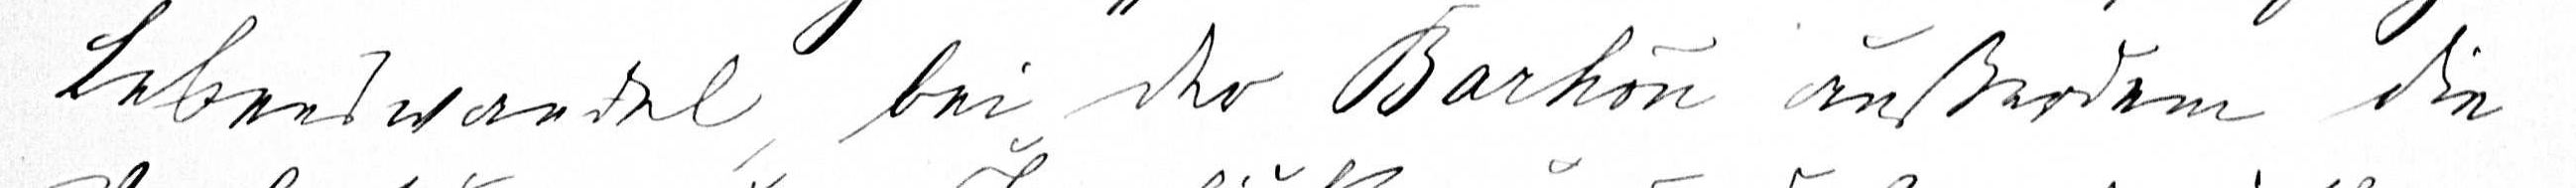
Lebenswandel, bei der Barhxx außerdem die
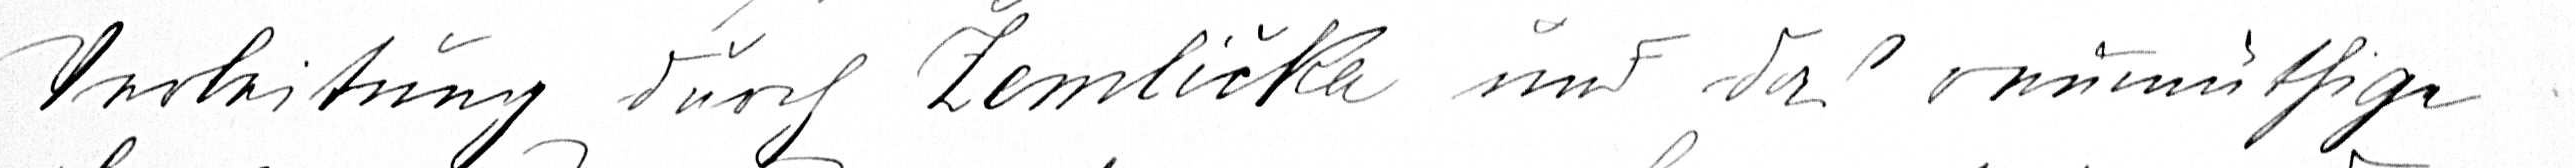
Verleitung durch Žemlička und das reumüthige
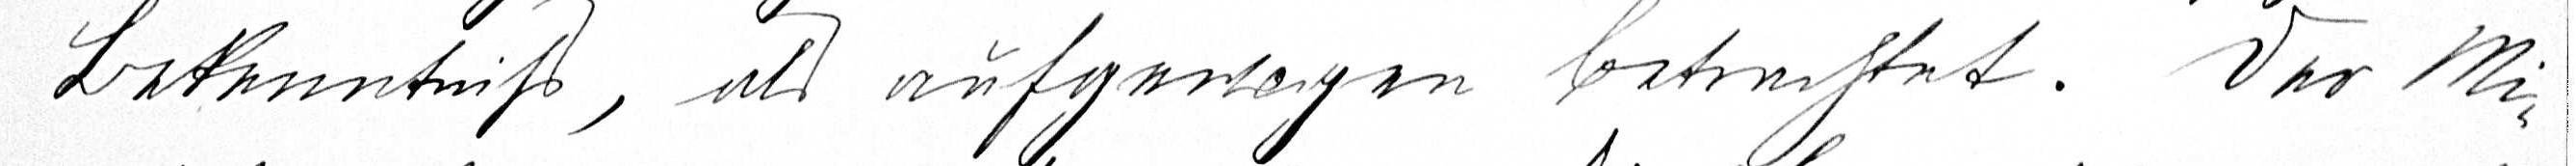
Bekenntniss, als aufgewogen betrachtet. Der Mi¬
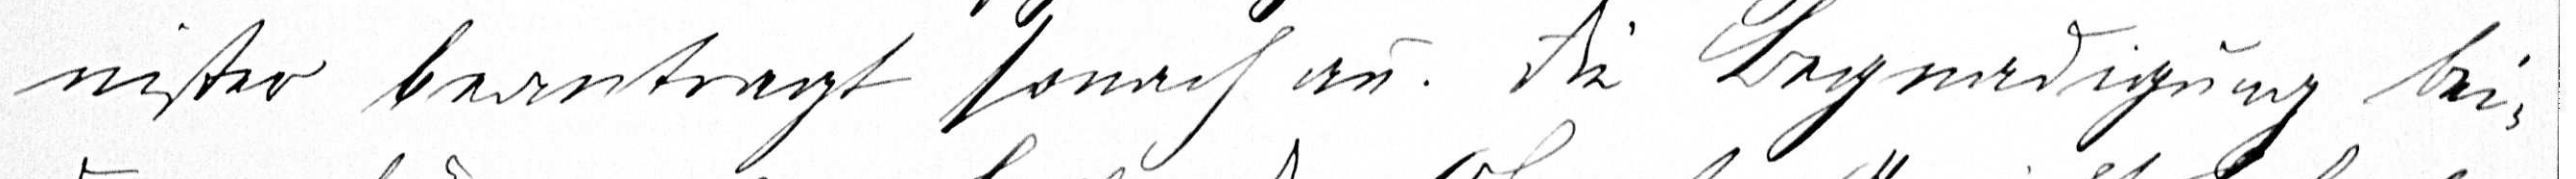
nister beantragt sonach an. Die Begnadigung bei¬
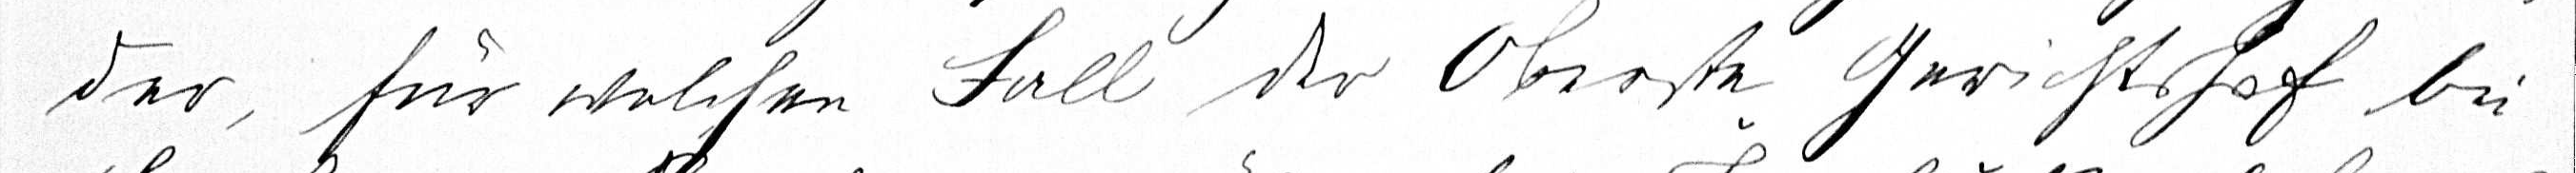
der, für welchen Fall der Oberste Gerichtshof bei
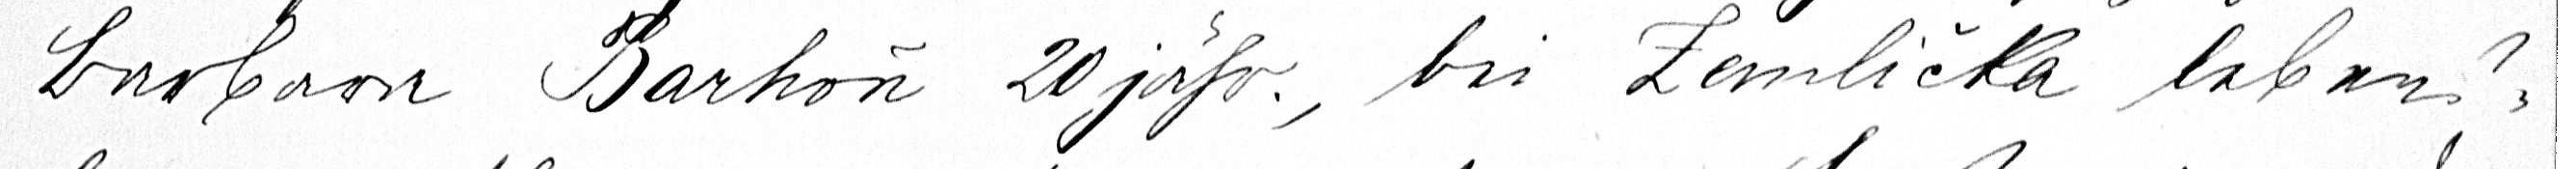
Barbara Barhxx 20jähr., bei Žemlička lebens¬
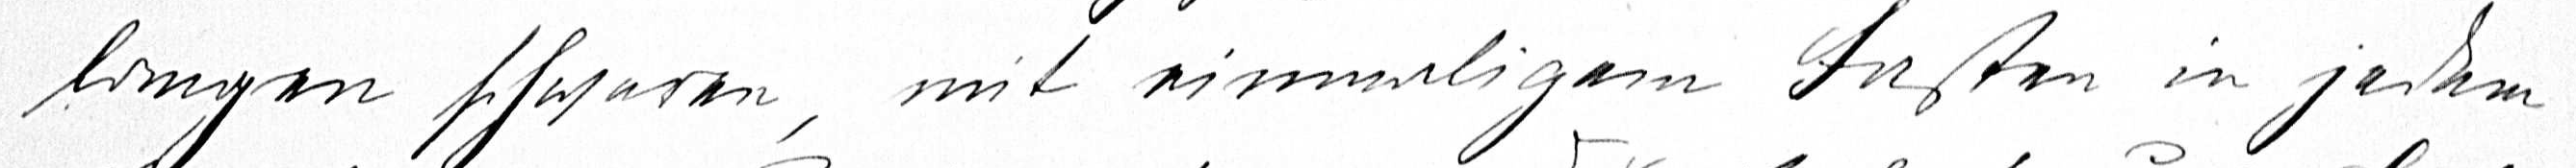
langen schweren, mit einmaligem Fasten in jedem
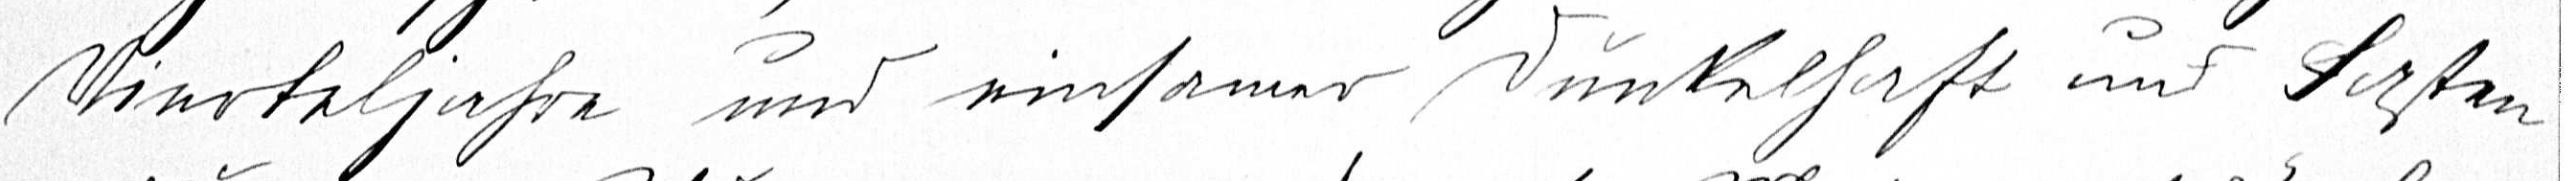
Vierteljahre und einsamer Dunkelhaft und Fasten
